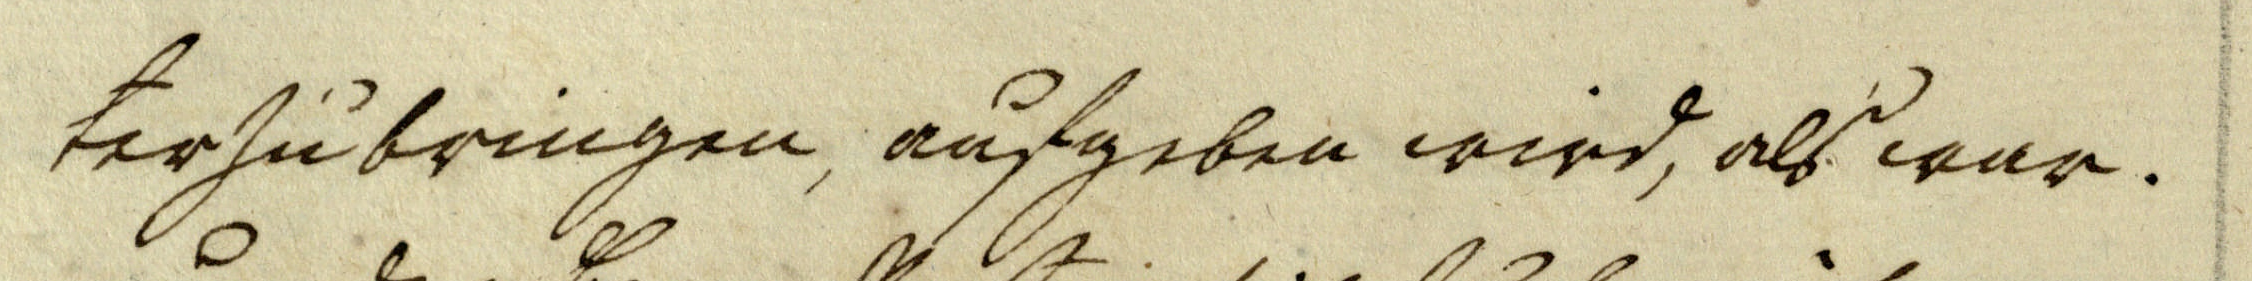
terzubringen, aufgeben wird, als war¬
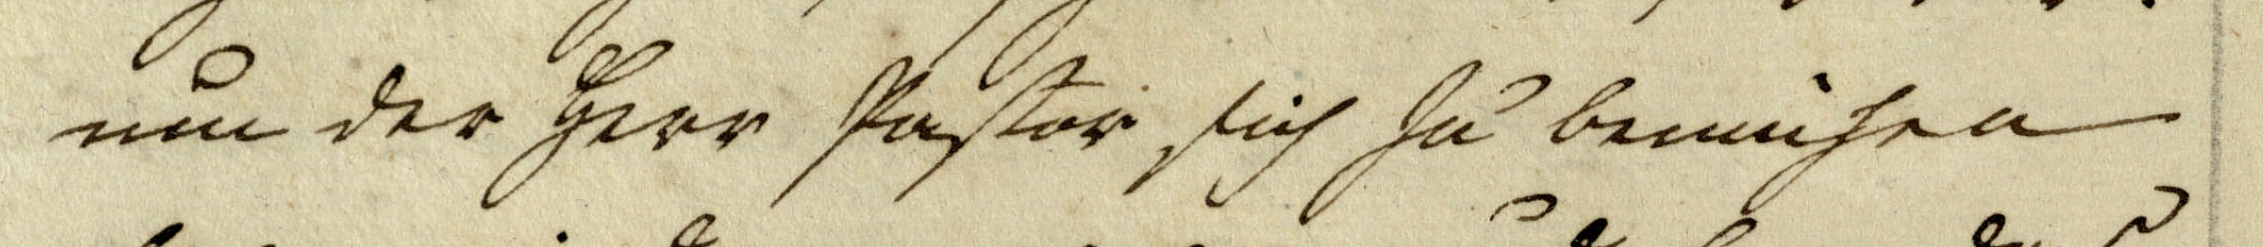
um der Herr Pastor sich zu bemühen
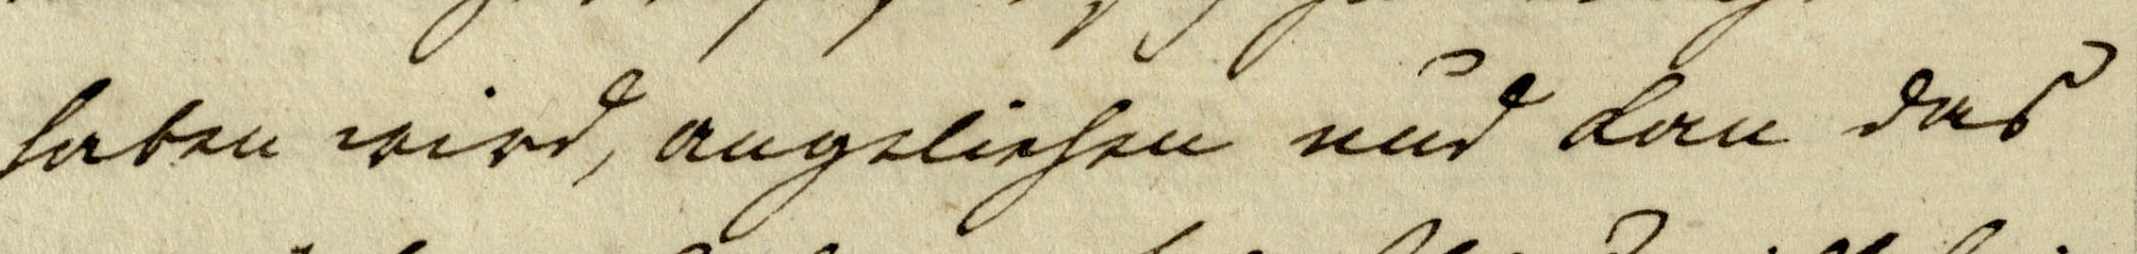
haben wird, angeliehen und kan das
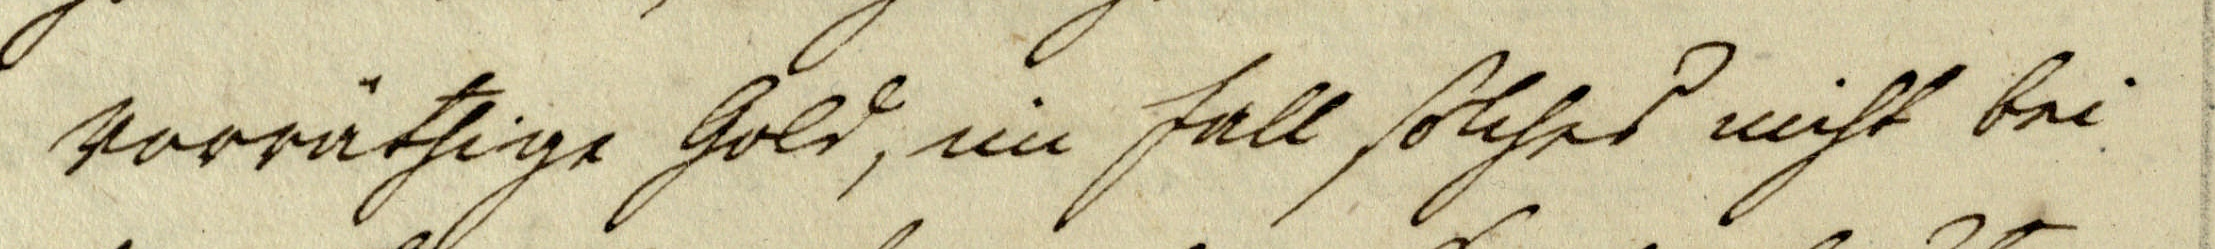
vorräthige Gold, im Fall solches nicht bei
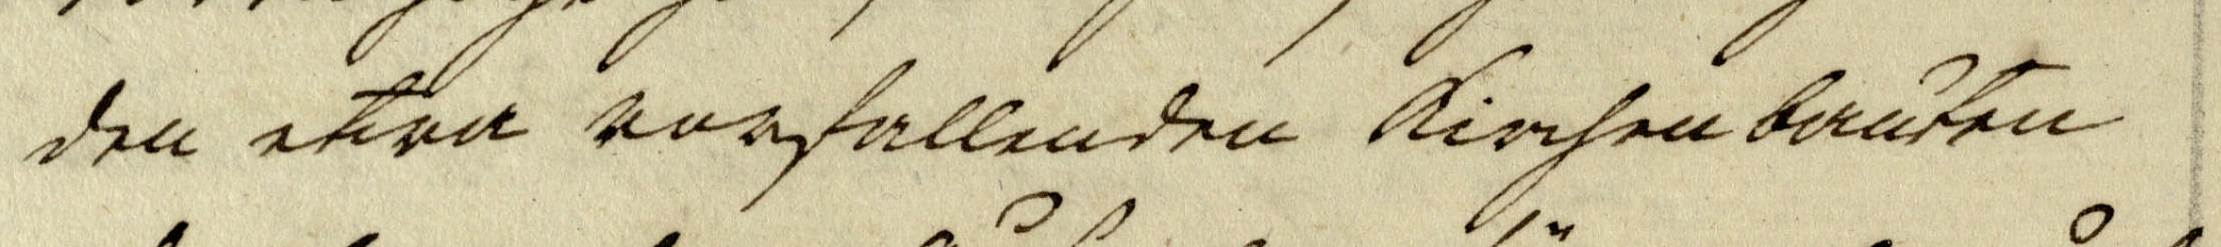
den etwa vorfallenden Kirchenbauten
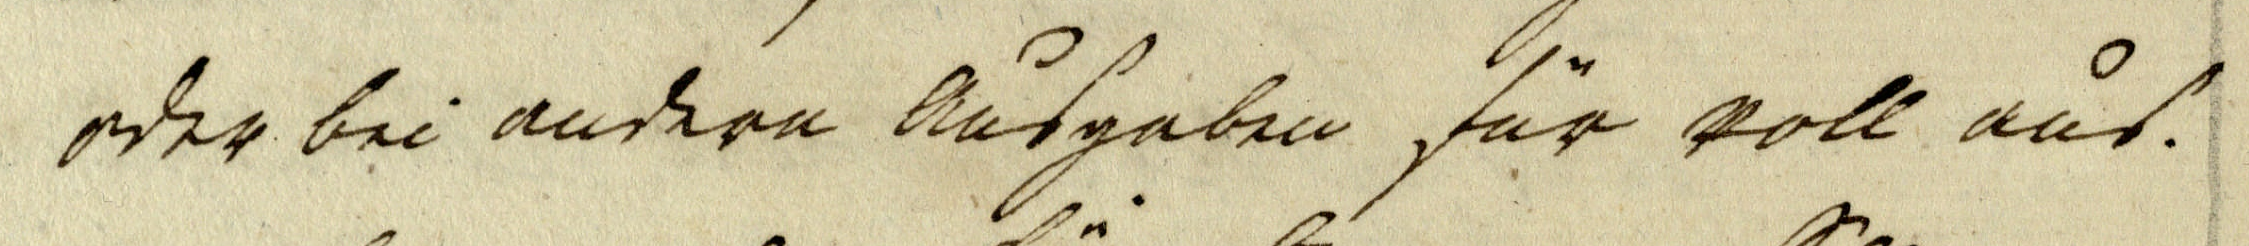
oder bei andern Ausgaben für voll aus¬
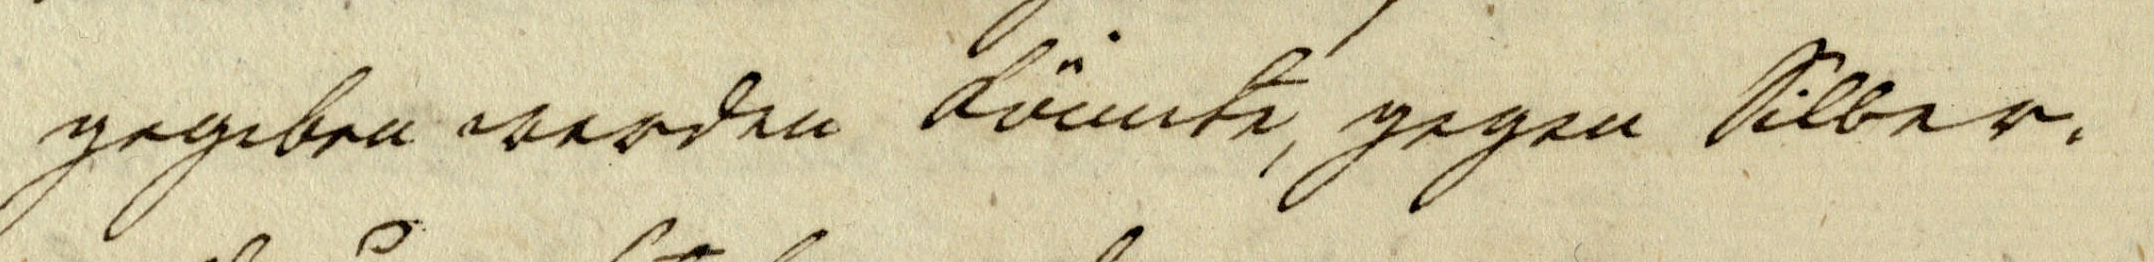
gegeben werden könnte, gegen Silber¬
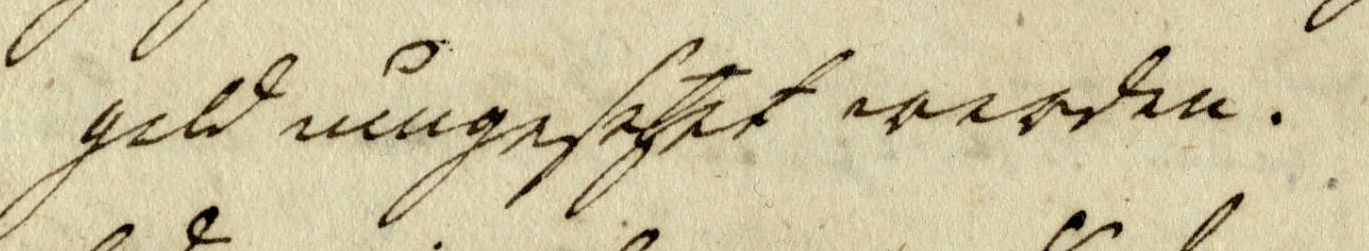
geld umgesetzet werden.
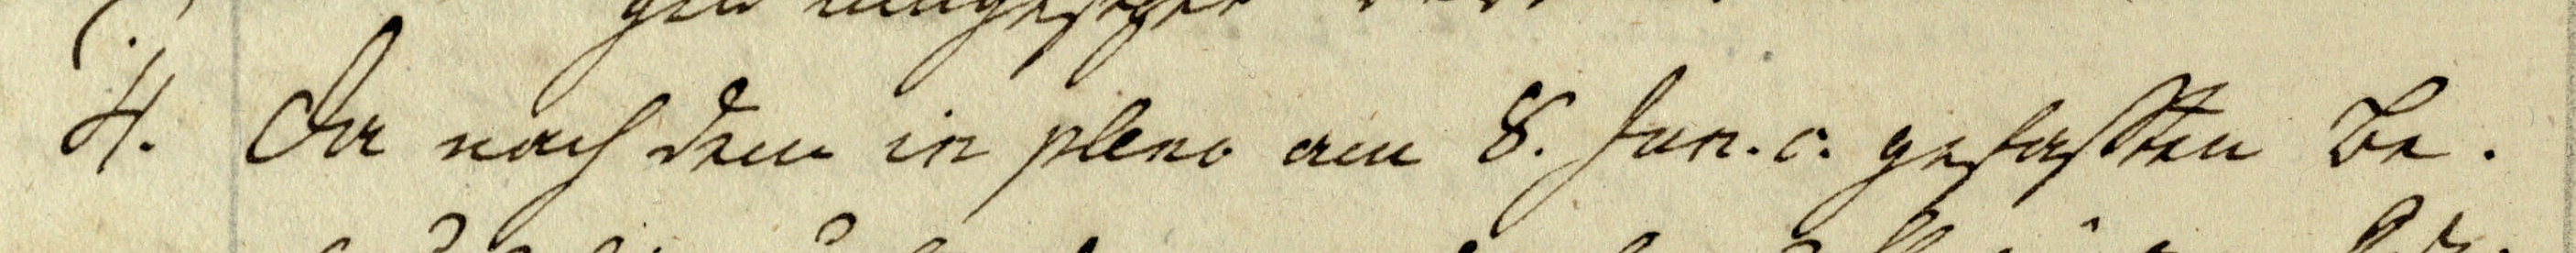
4. Da nach dem in pleno am 8., Jun. c. gefaßten Be¬
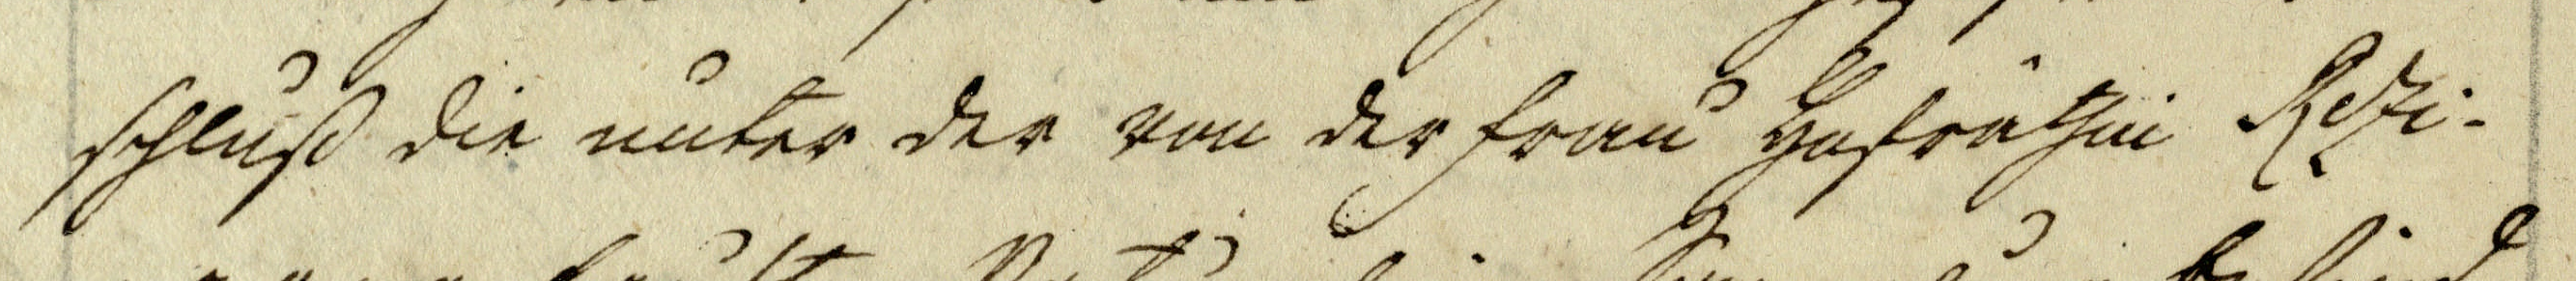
schluß die unter der von der Frau Hofräthin Rezi¬
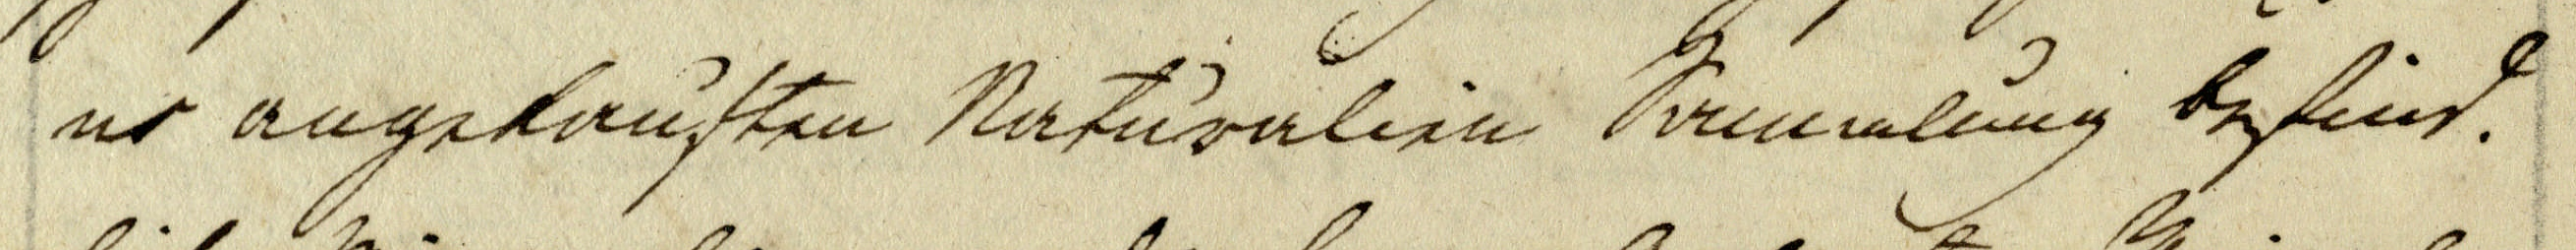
us angekauften Naturalien Sammlung befind¬
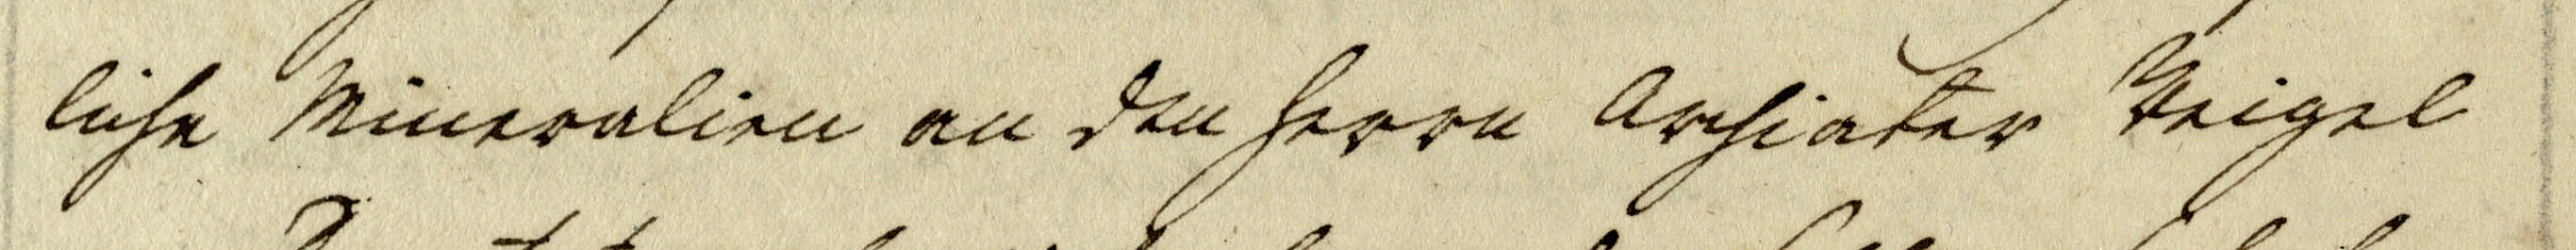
liche Mineralien an den Herrn Archiater Weigel
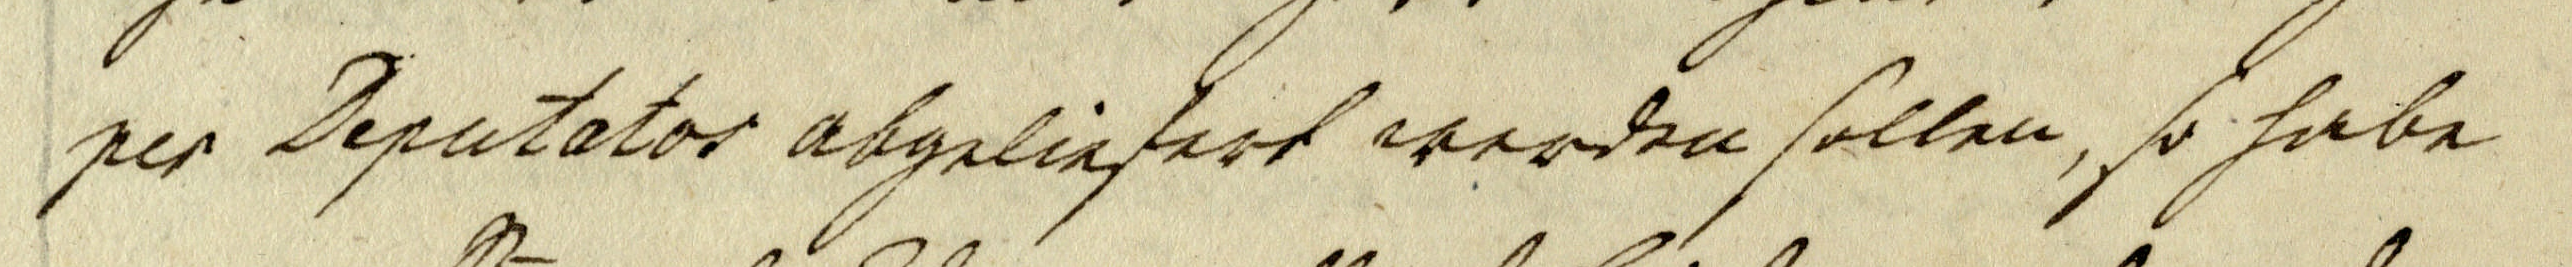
per Deputatos abgeliefert werden sollen, so habe
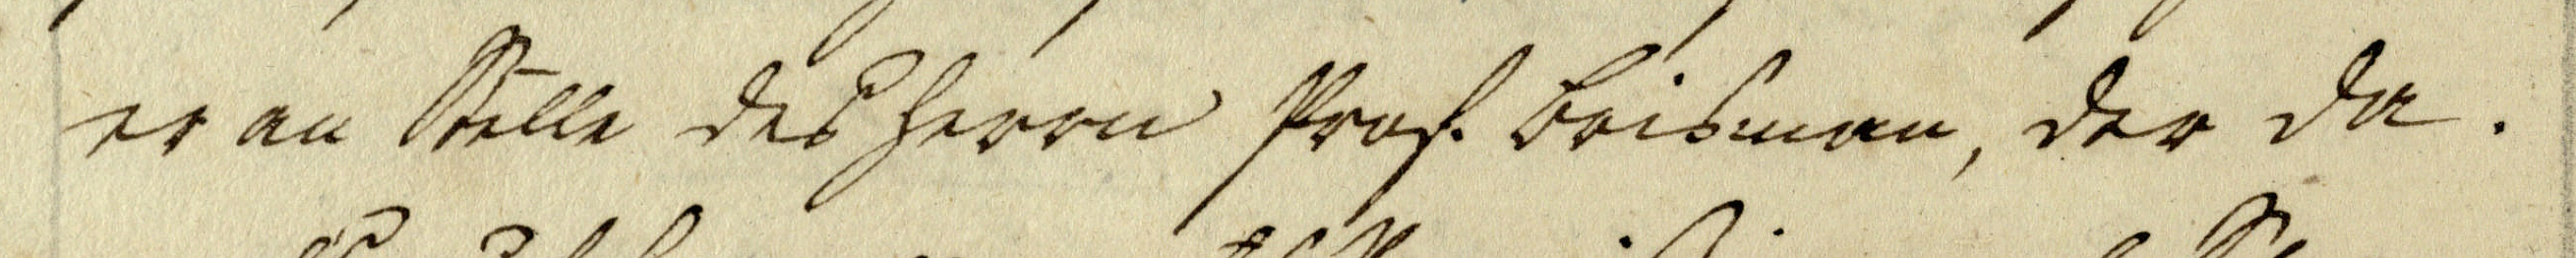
er an Stelle des Herrn Prof. Brisman, der da¬
